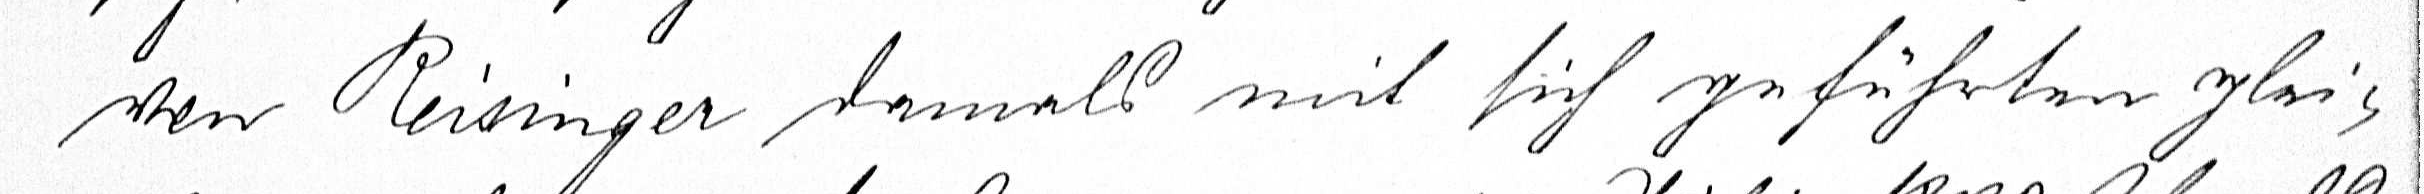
von Reisinger damals mit sich geführten glei¬
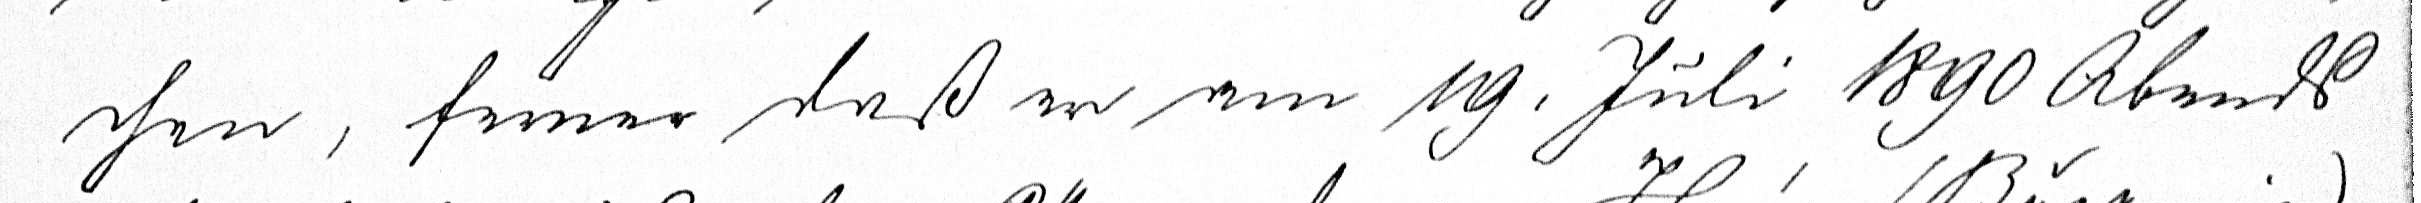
chen, ferner daß er am 19. Juli 1890 Abends
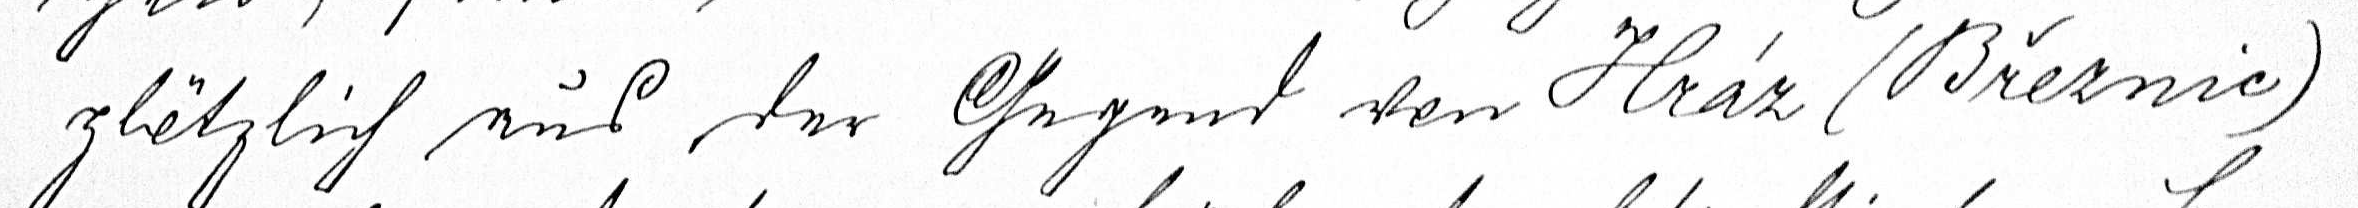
plötzlich aus der Gegend von Hráz (Březnic)
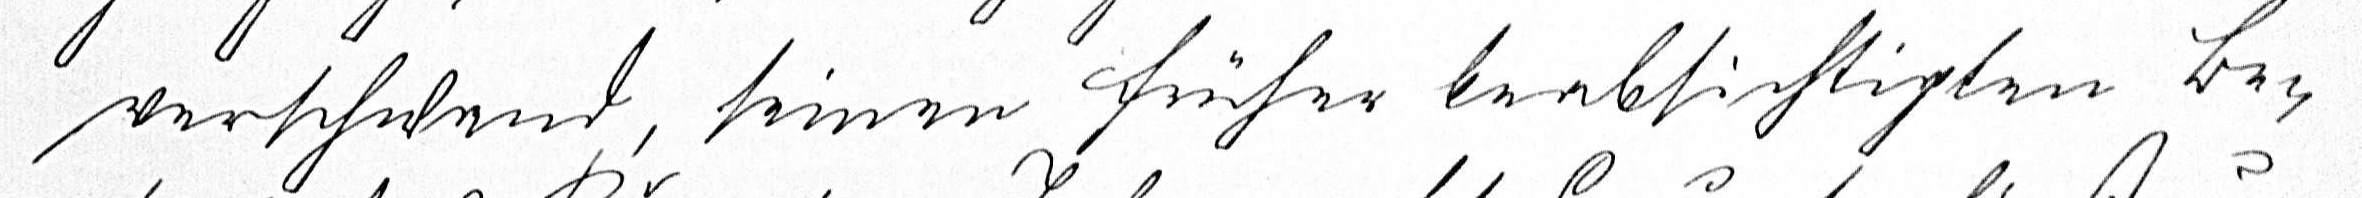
verschwand, seiner früher beabsichtigten Be¬
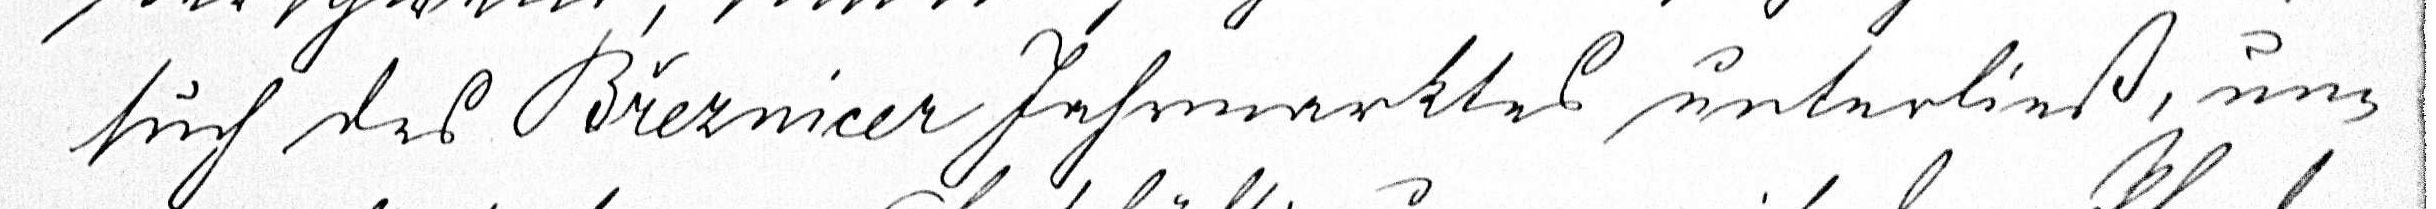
such des Březnicer Jahrmarkt unterließ, un¬
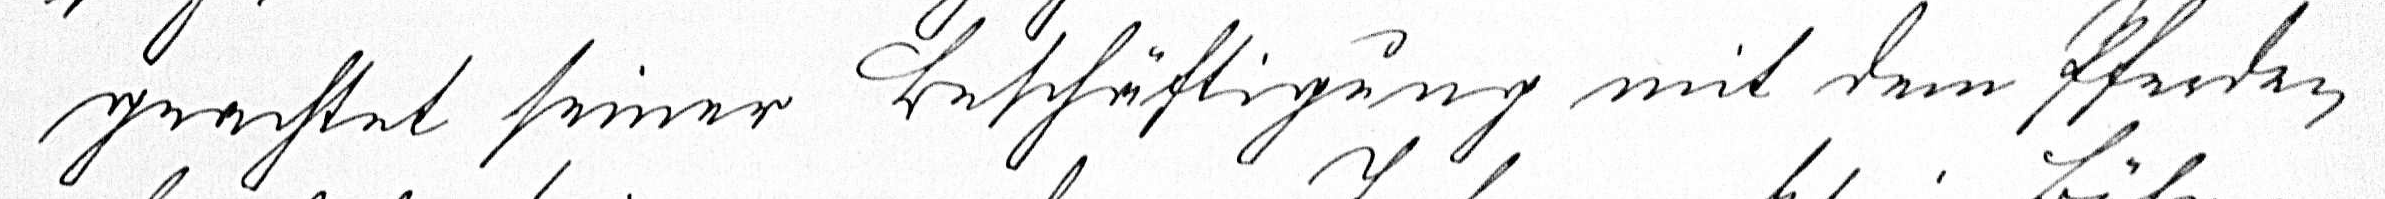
geachtet seiner Beschäftigung mit dem Pferde¬
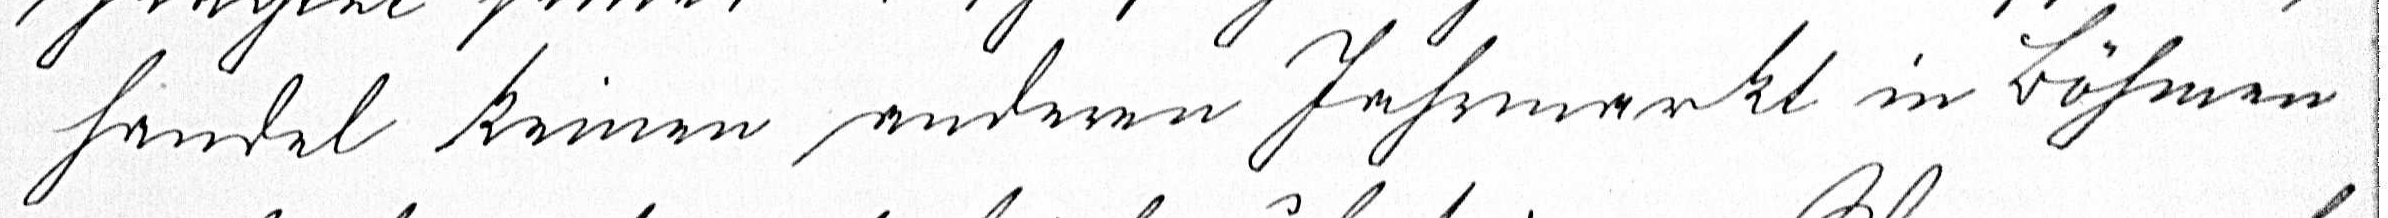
handel keinen anderen Jahrmarkt in Böhmen
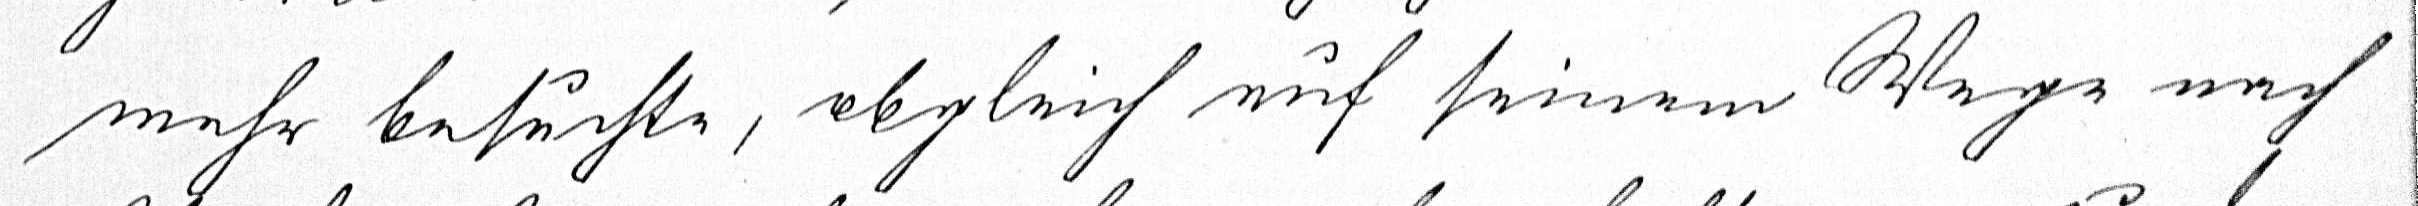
mehr besuchte, obgleich auf seinem Wege nach
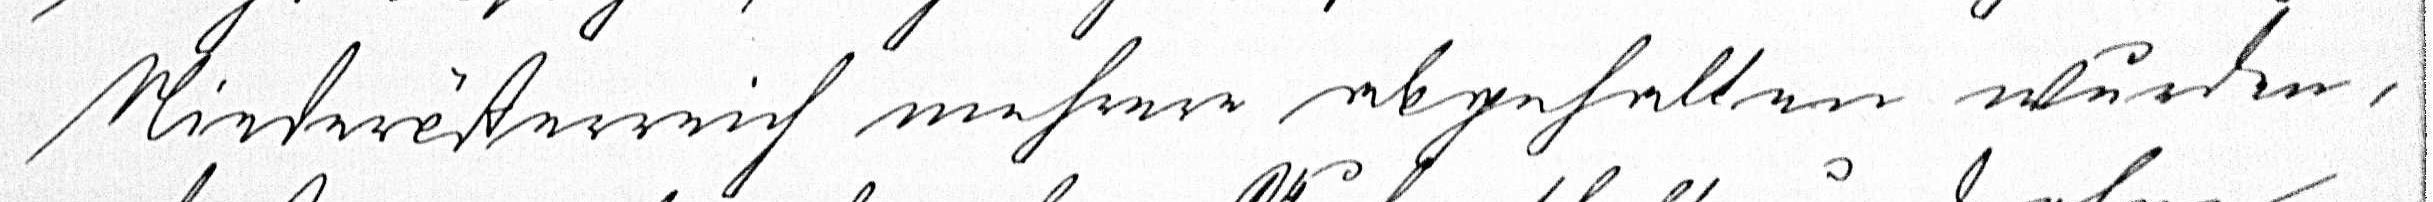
Niederösterreich mehrere abgehalten wurden,
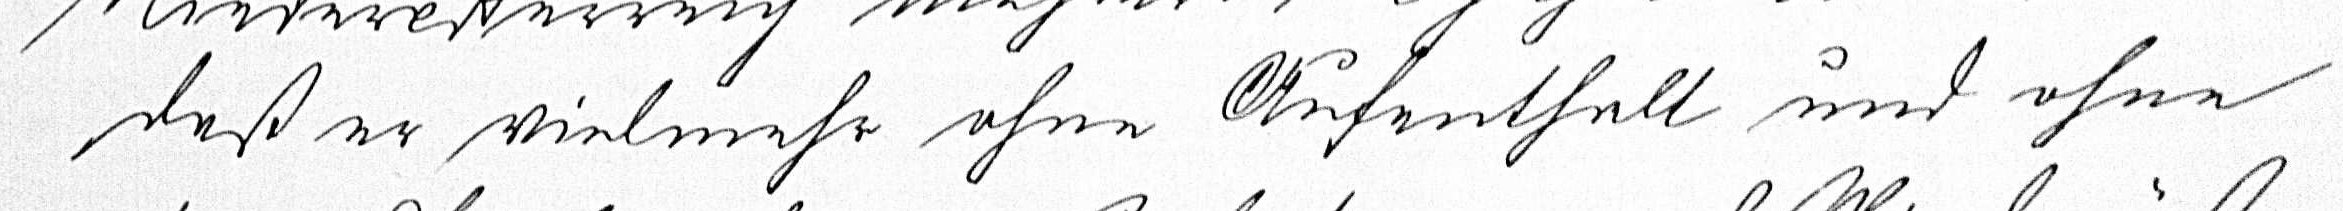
daß er vielmehr ohne Aufenthalt und ohne
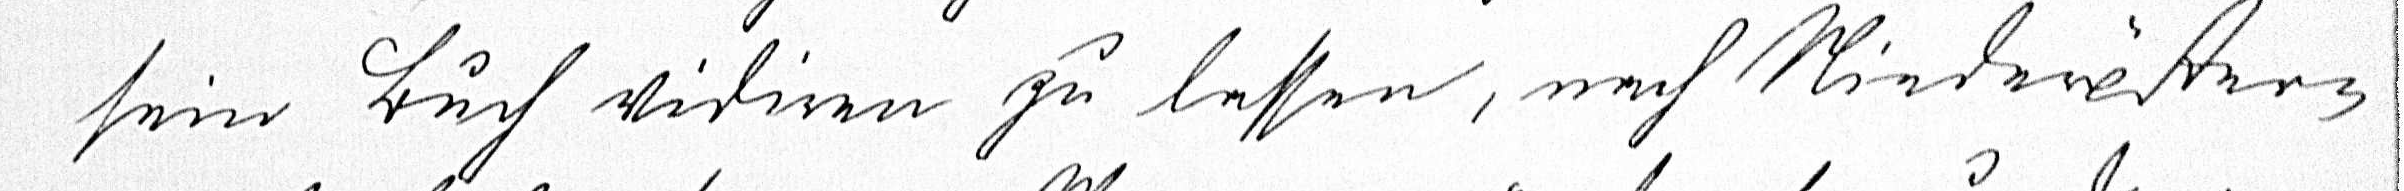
sein Buch vidiren zu lassen , nach Niederöster¬
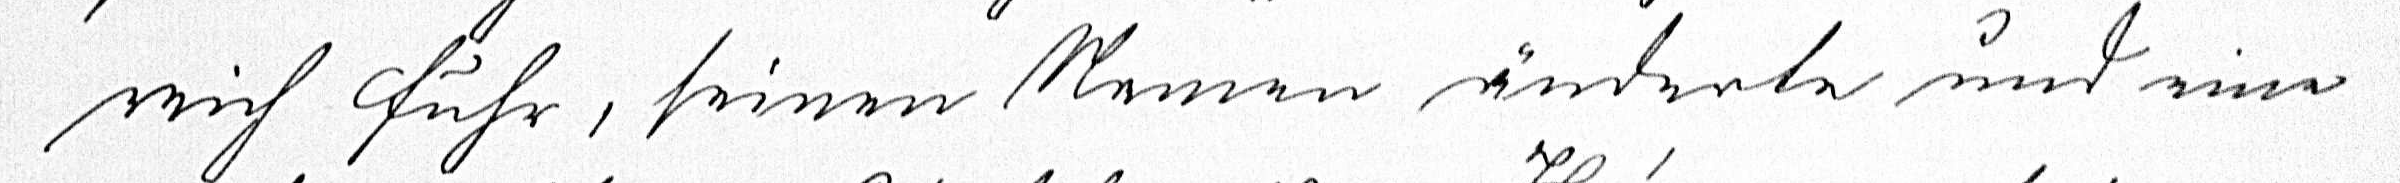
reich fuhr, seinen Namen änderte und eine
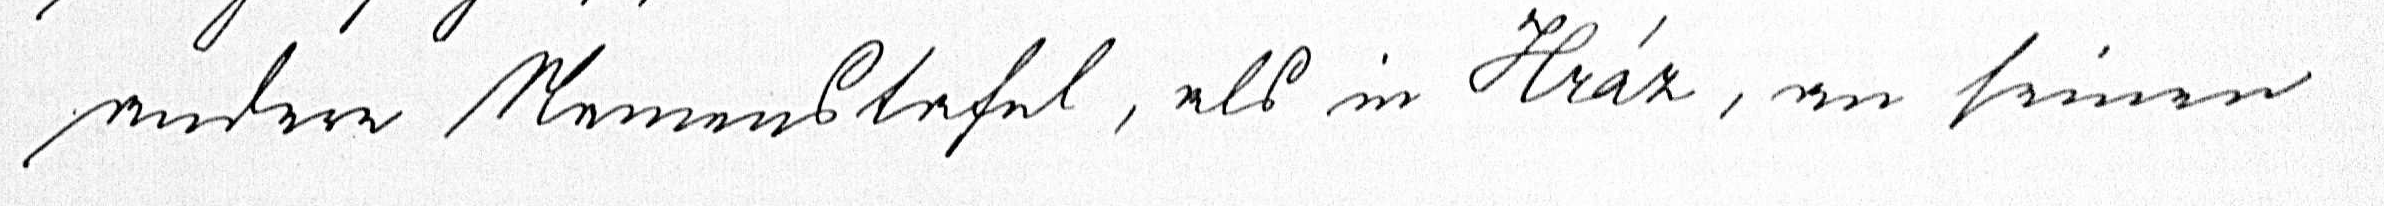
andere Namenstafel, als in Hráz, an seinen
